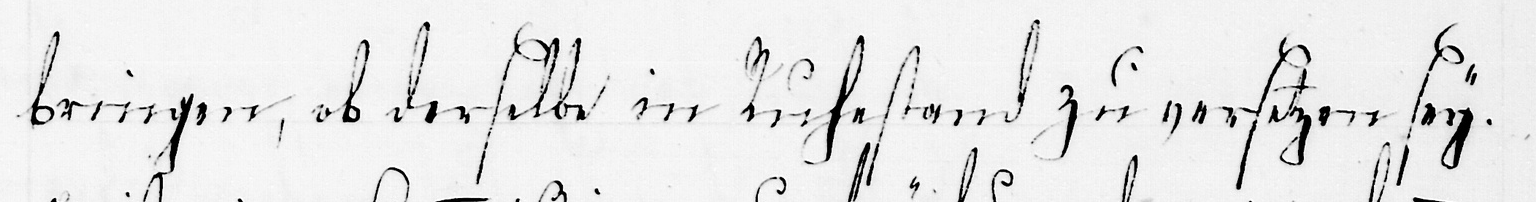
bringen, ob derselbe in Ruhestand zu versetzen sey.
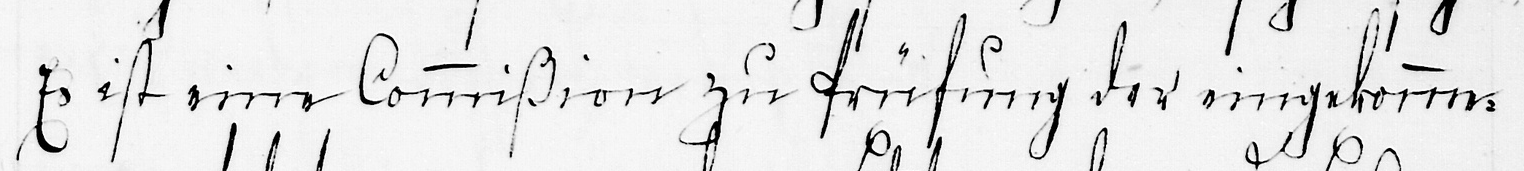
Es ist eine Commißion zu Prüfung der eingekomme¬
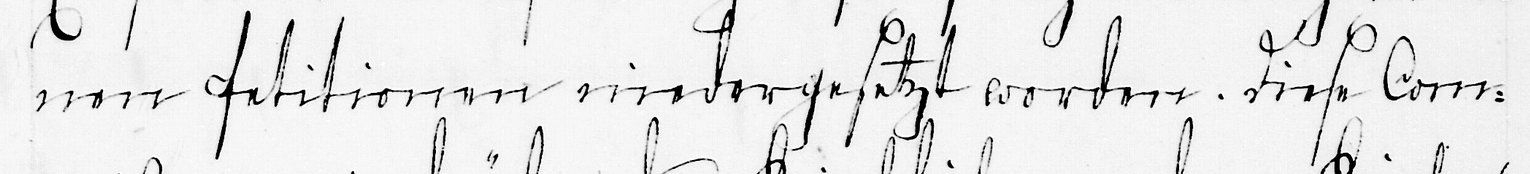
nen Petitionen niedergesetzt worden. Diese Com¬
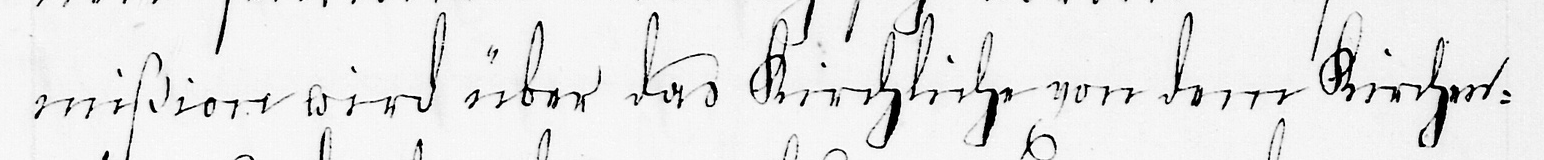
mißion wird über das Kirchliche von dem Kirchen¬
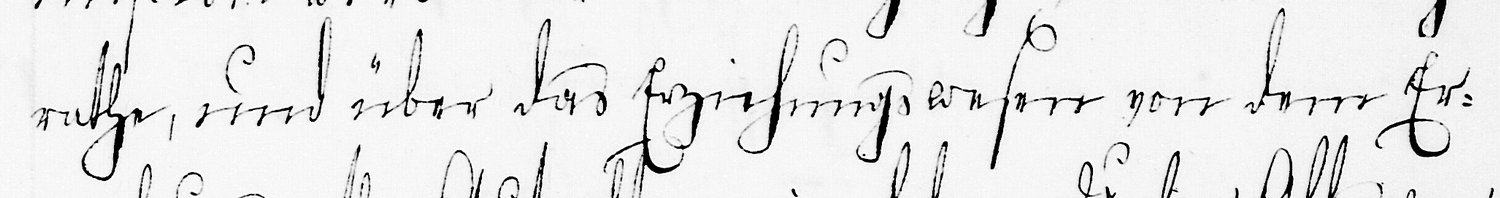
rathe, und über das Erziehungswesen von dem Er¬
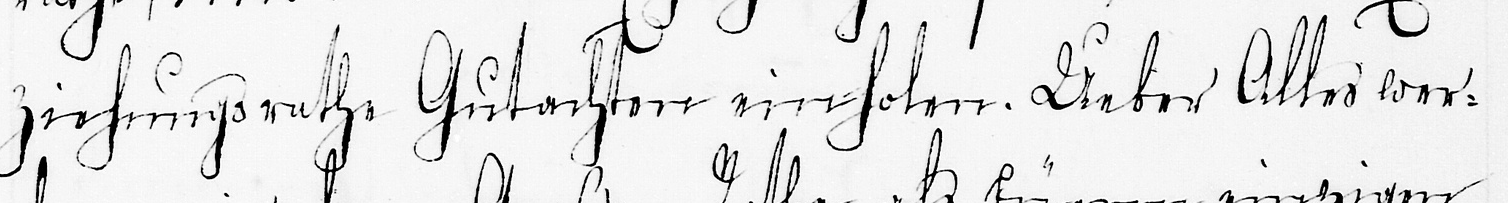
ziehungsrathe Gutachten einholen. Ueber Alles wer¬
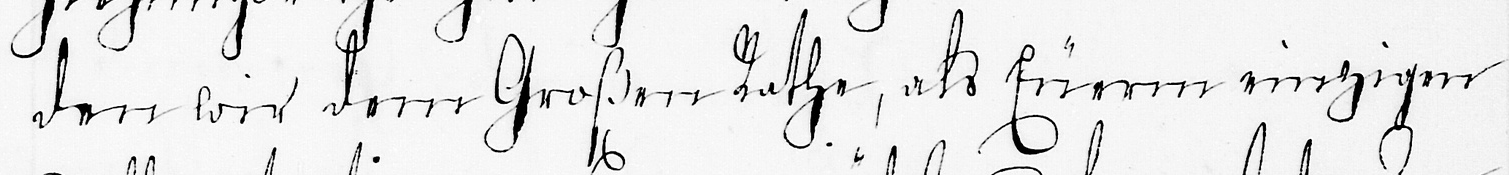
den wir dem Großen Rathe, als Eurem einzigen
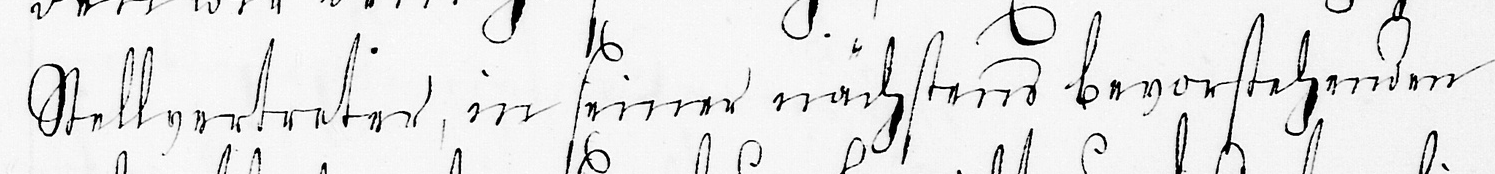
Stellvertreter, in seiner nächstens bevorstehenden
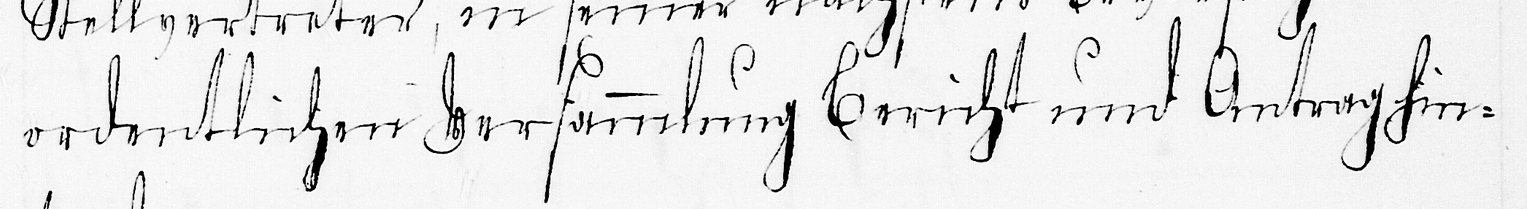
ordentlichen Versammlung Bericht und Antrag hin¬
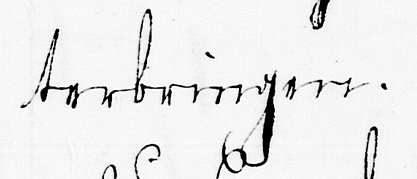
terbringen.
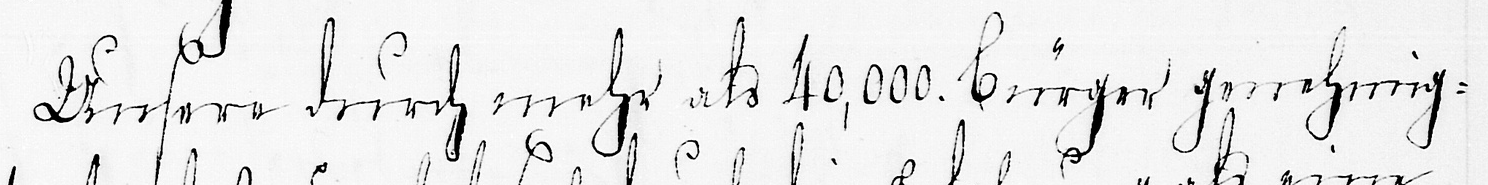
Unsere durch mehr als 40,000. Bürger genehmig¬
